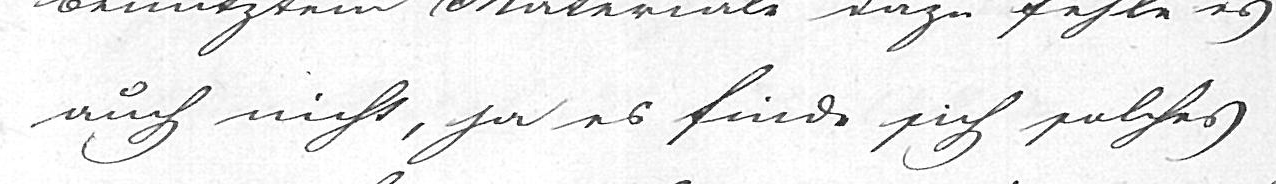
auch nicht, ja es finde sich solches
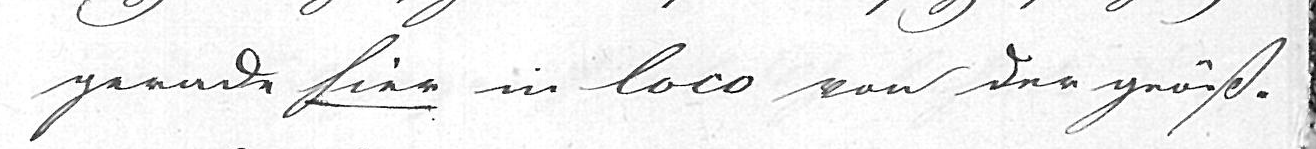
gerade hier in loco von der größ-
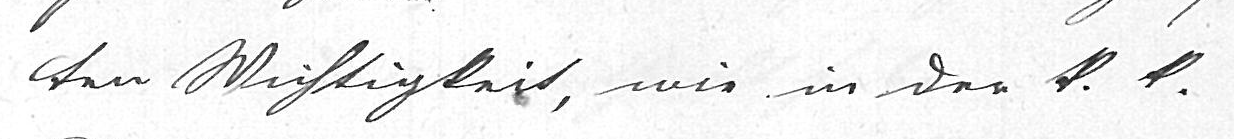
ten Wichtigkeit, wie in der k. k.
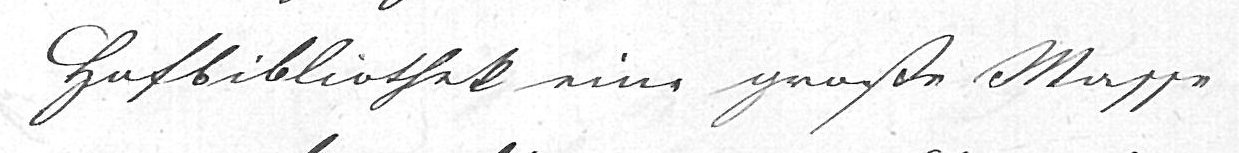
Hofbibliothek eine große Masse
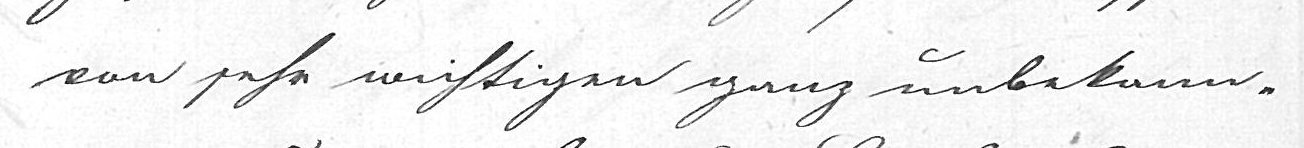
von sehr wichtigen ganz unbekann-
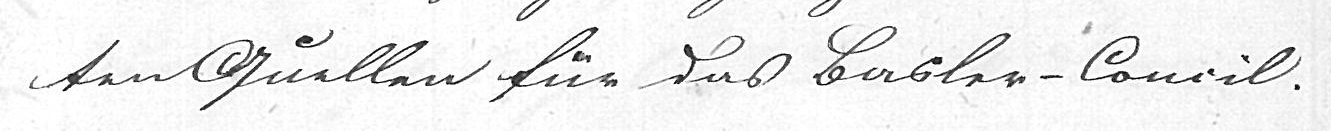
ten Quellen für das Basler-Concil.
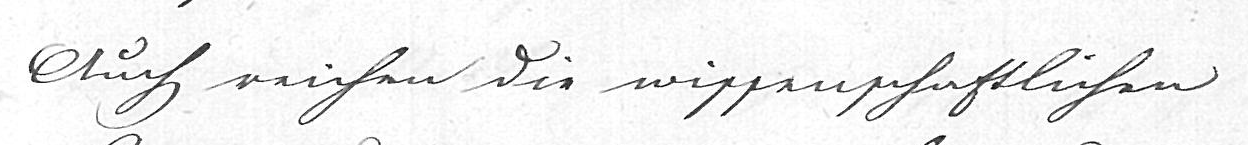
Auch reichen die wissenschaftlichen
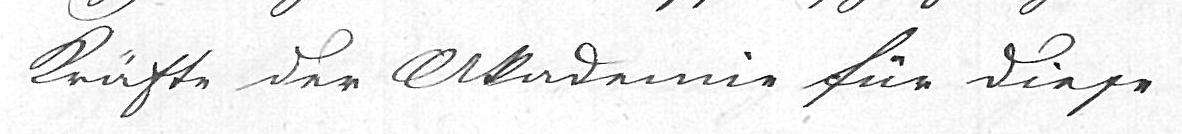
Kräfte der Akademie für diese
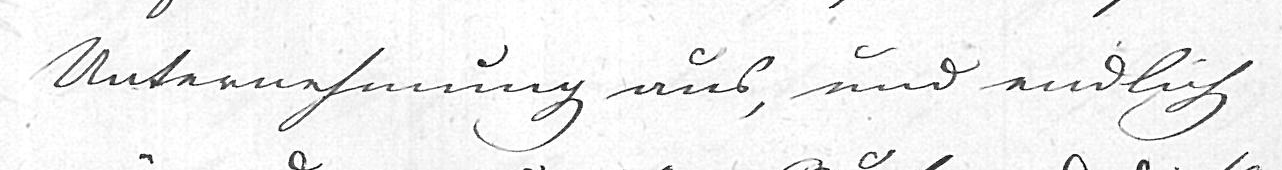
Unternehmung aus, und endlich
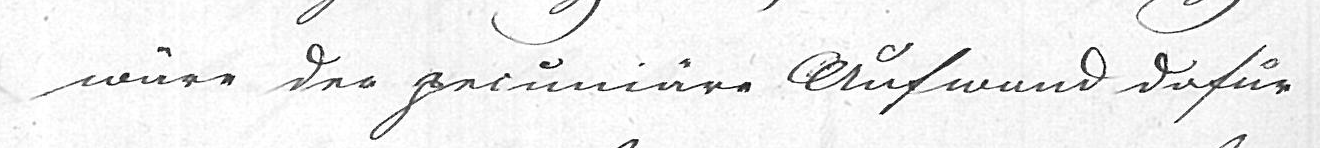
wäre der pecuniäre Aufwand dafür
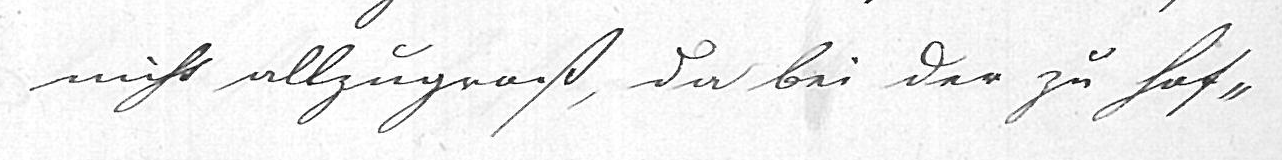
nicht allzugroß, da bei der zu hof-
